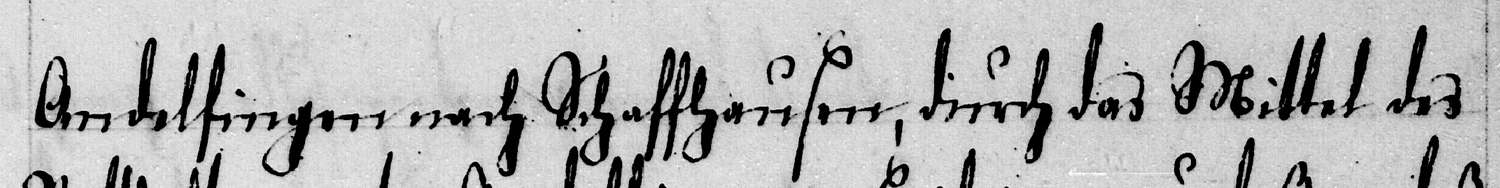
Andelfingen nach Schaffhausen, durch das Mittel des
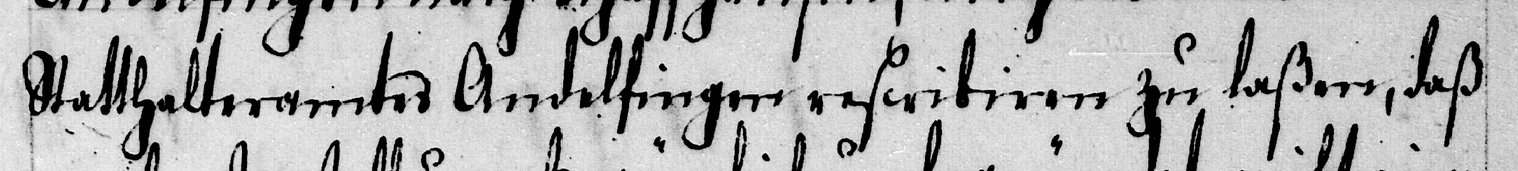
Statthalteramtes Andelfingen rescribiren zu laßen, daß
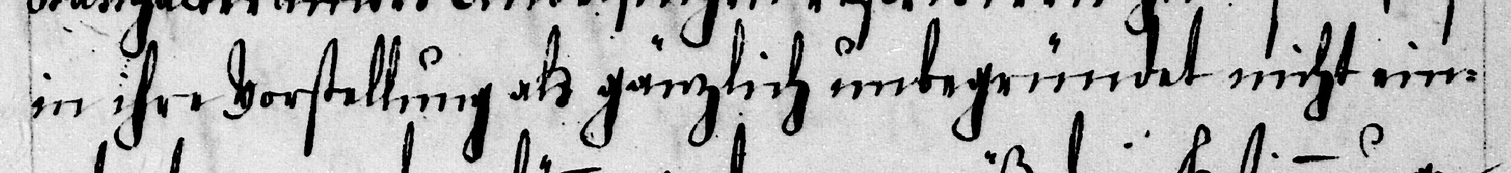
in ihre Vorstellung als gänzlich unbegründet nicht ein¬
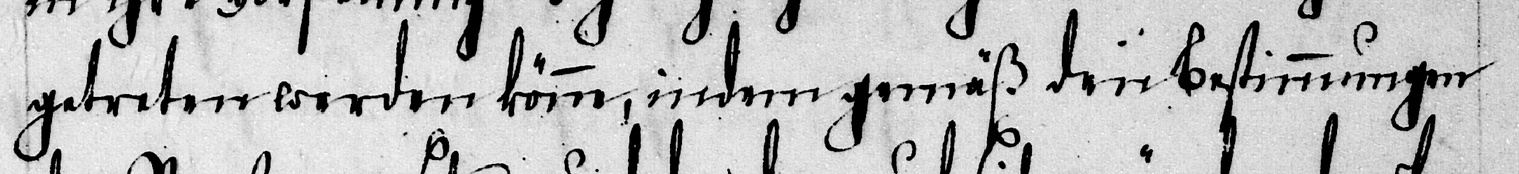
getreten werden könne, indem gemäß den Bestimmungen
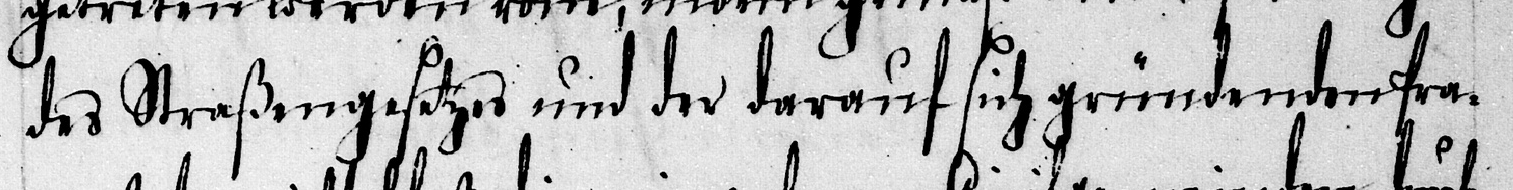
des Straßengesetzes und der darauf sich gründenden Pra¬
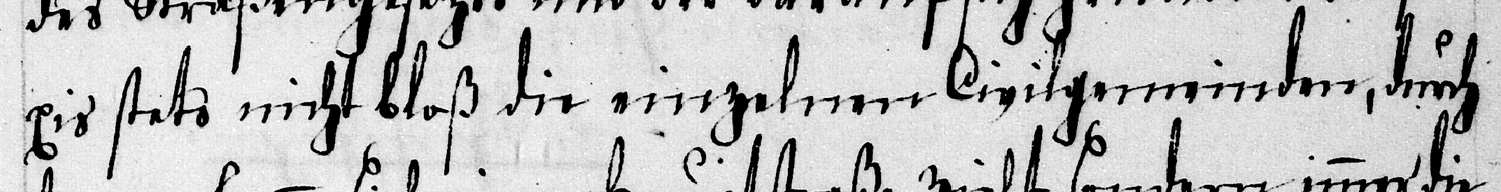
xis stets nicht bloß die einzelnen Civilgemeinden, durch
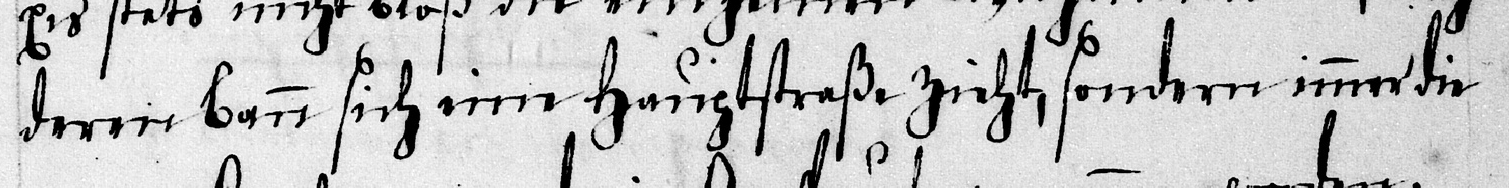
deren Bau sich eine Hauptstraße zieht, sondern immer die
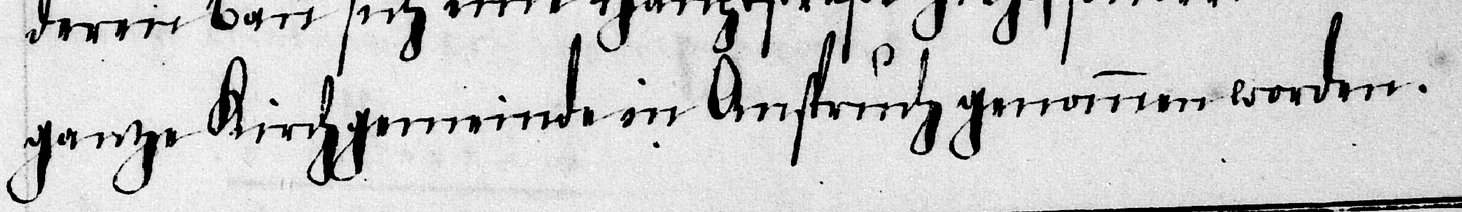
ganze Kirchgemeinde in Anspruch genommen worden.
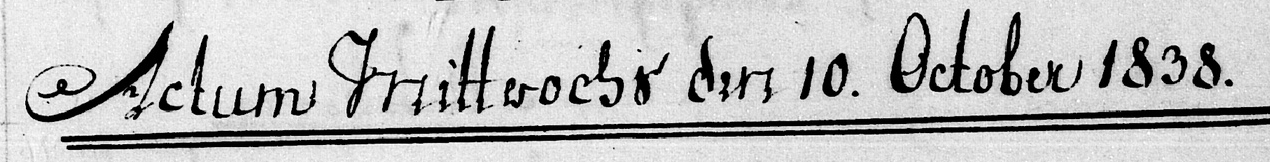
Actum Mittwochs den 10. October 1838.
